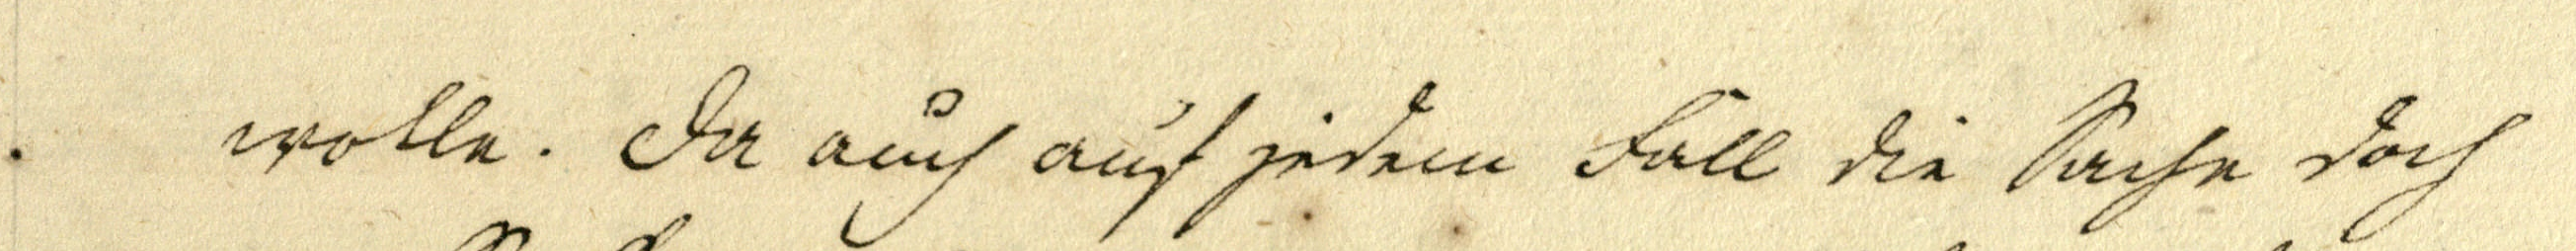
wolle. Da auch auf jeden Fall die Sache doch
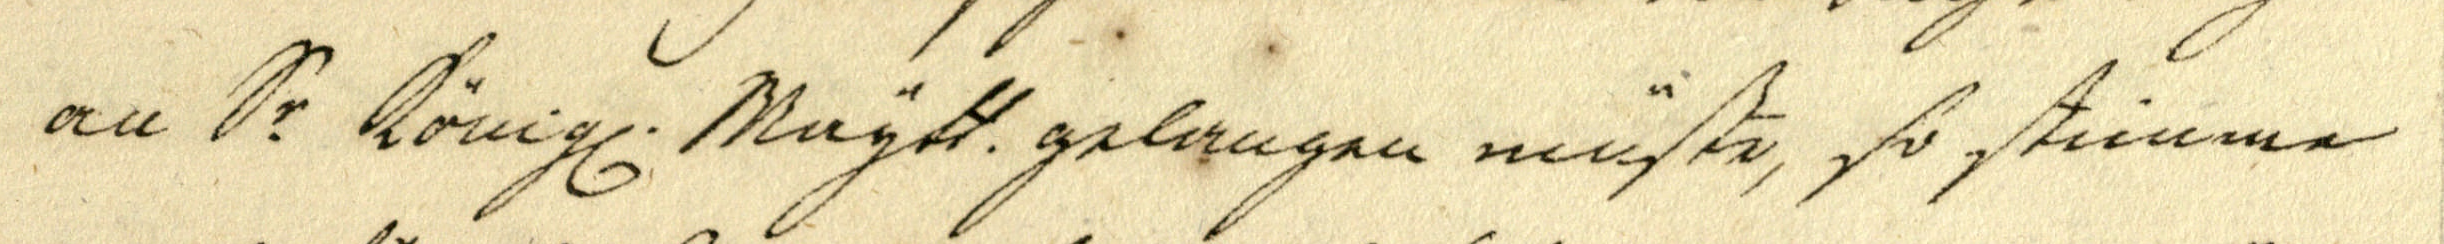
an Sr. Königl. Maÿtt. gelangen müste, so stimme
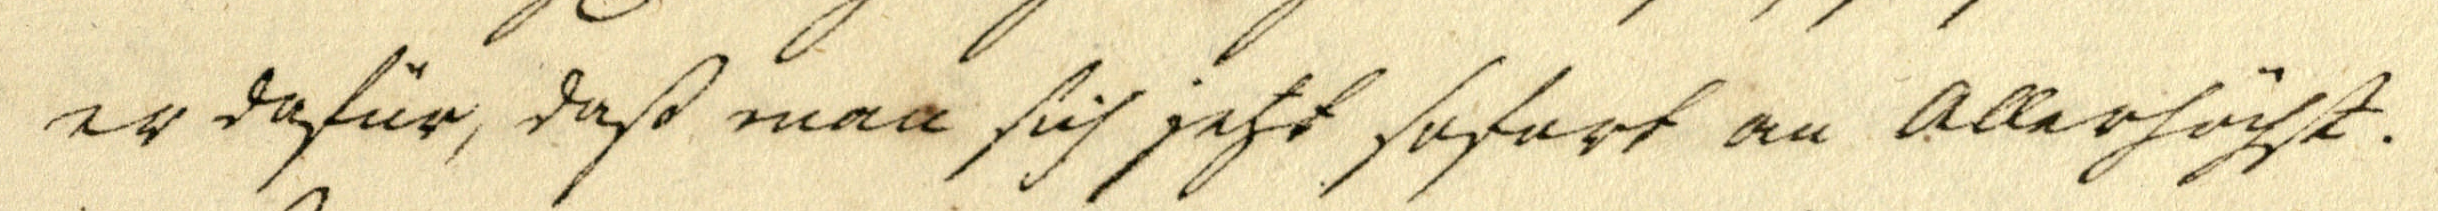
er dafür, daß man sich jetzt sofort an Allerhöchst¬
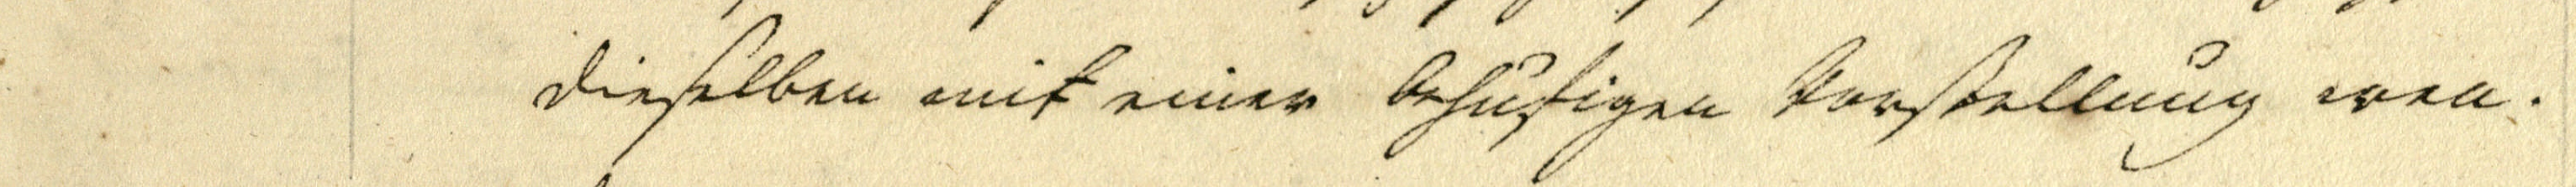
dieselben mit einer behufigen Vorstellung wen¬
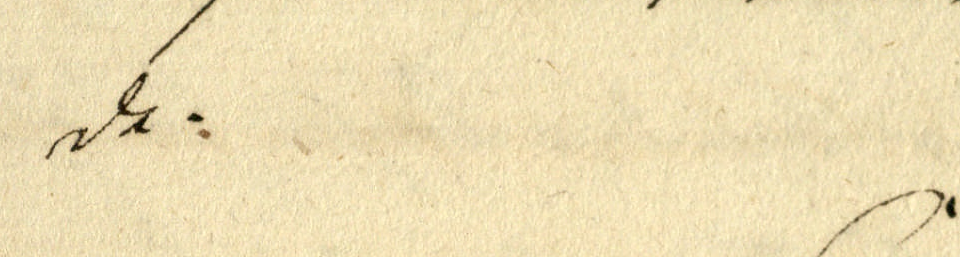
de.
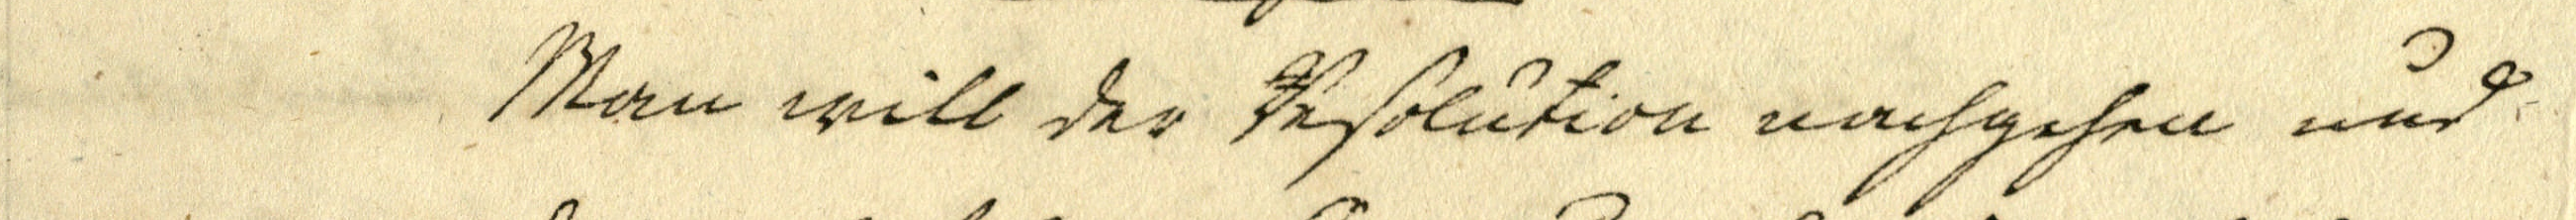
Man will der Resolution nachgehen und
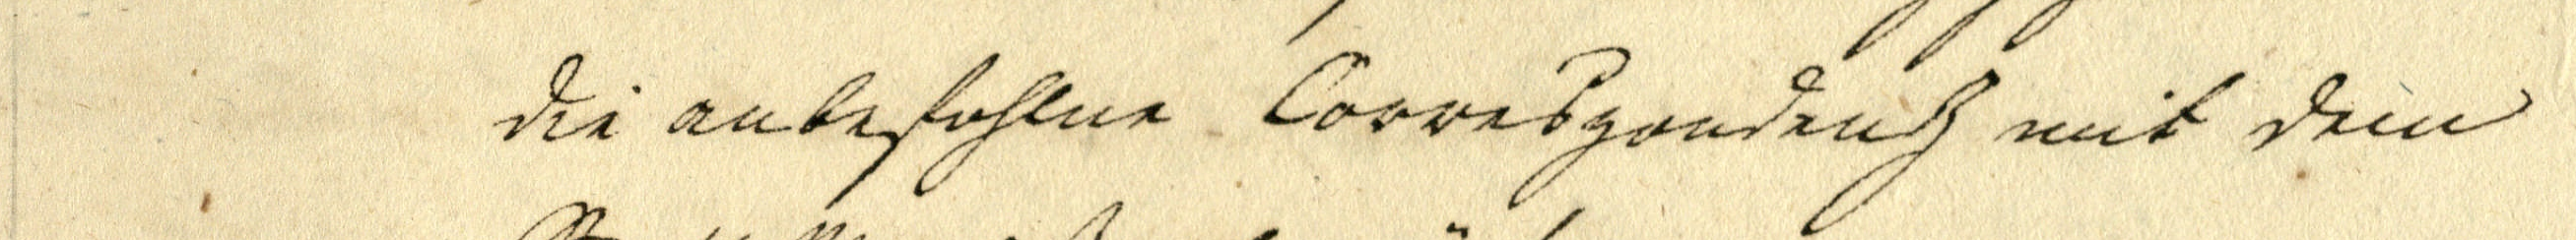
die anbefohlene Correspondenz mit dem
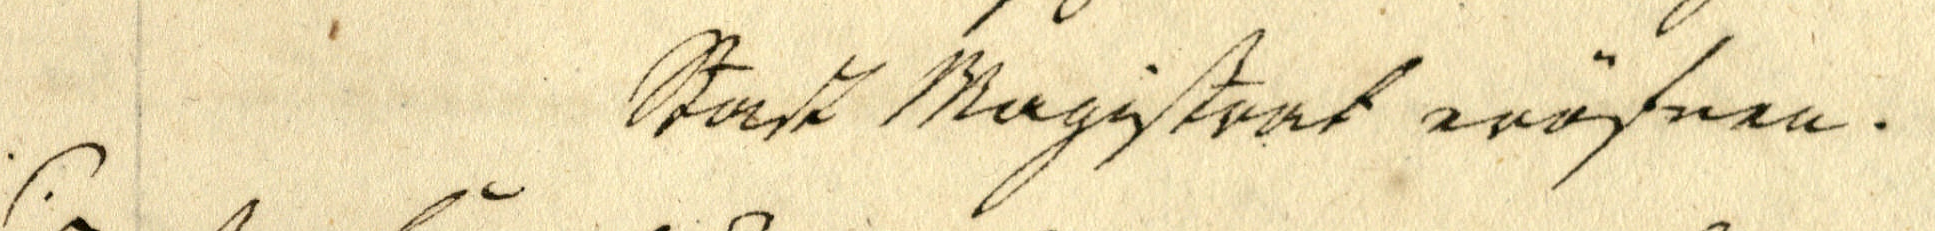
Stadt Magistrat eröfnen.
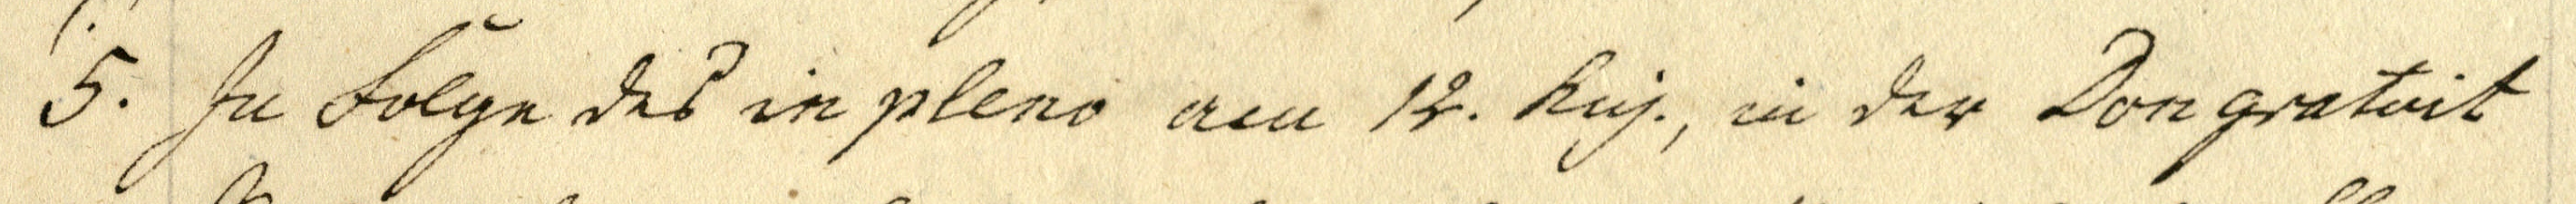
5. In Folge des in pleno am 12. huj., in der Don gratuit
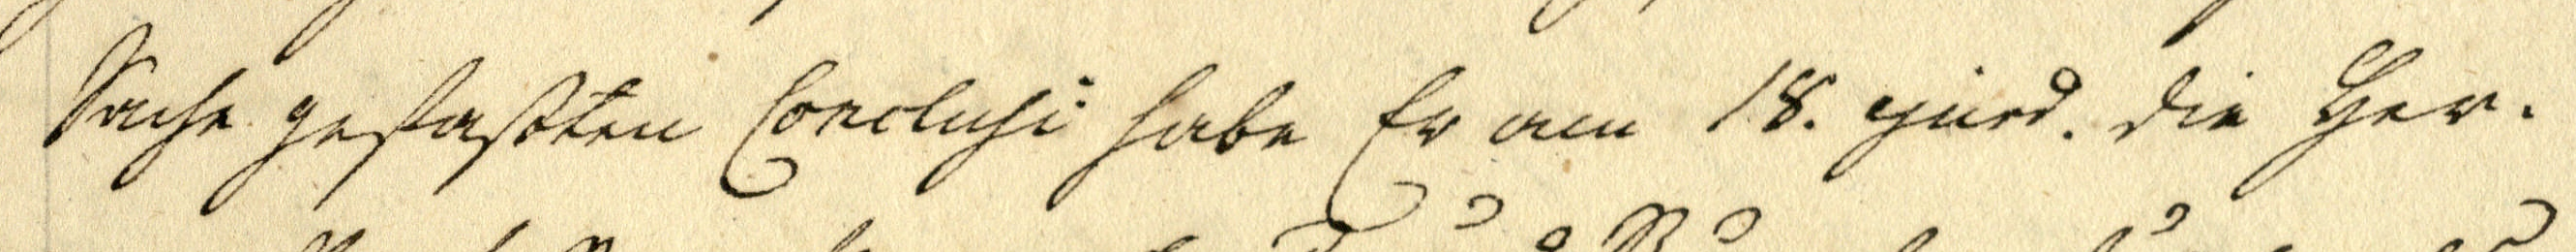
Sache gefaßten Conclusi habe Er am 18. ejusd. die Her¬
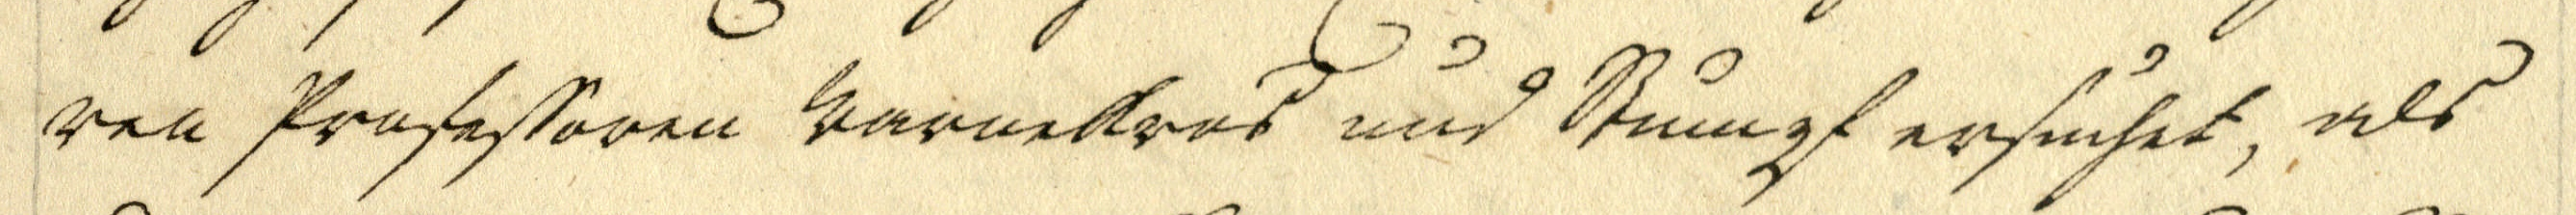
ren Professoren Warnekros und Stumpf ersuchet, als
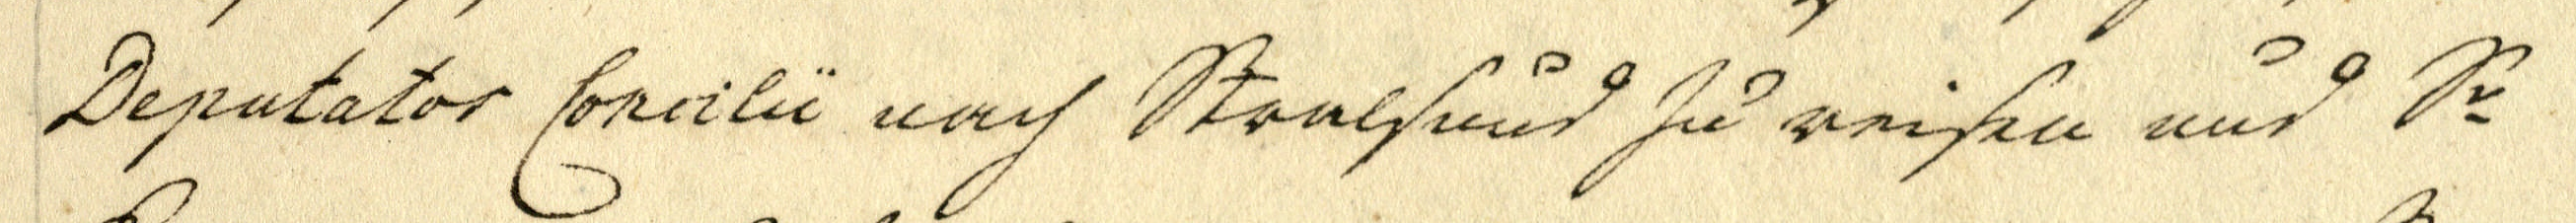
Deputatos Concilii nach Stralsund zu reisen und Sr.
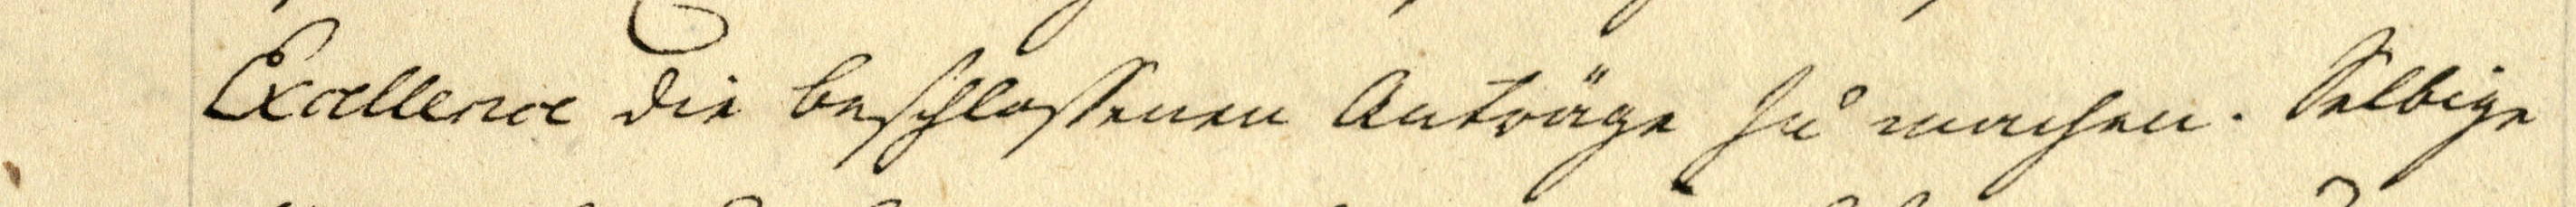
Excellence die beschlossenen Anträge zu machen. Selbige
